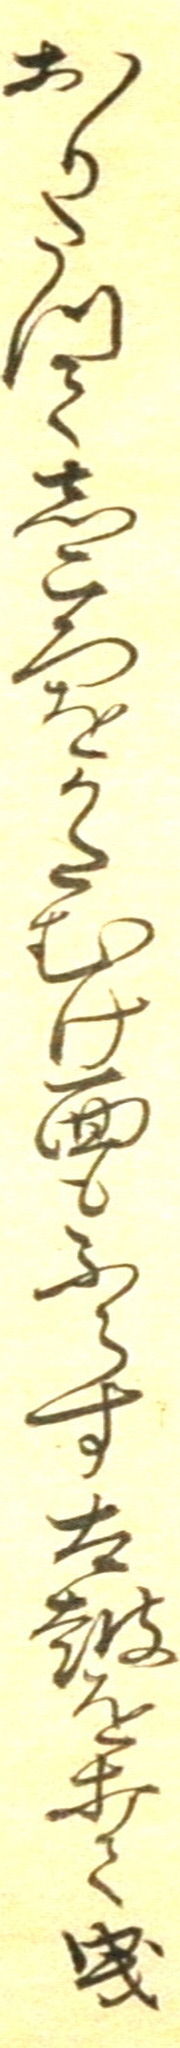おりたつてしころをかたむけ面もふらす太鼓を打て曳
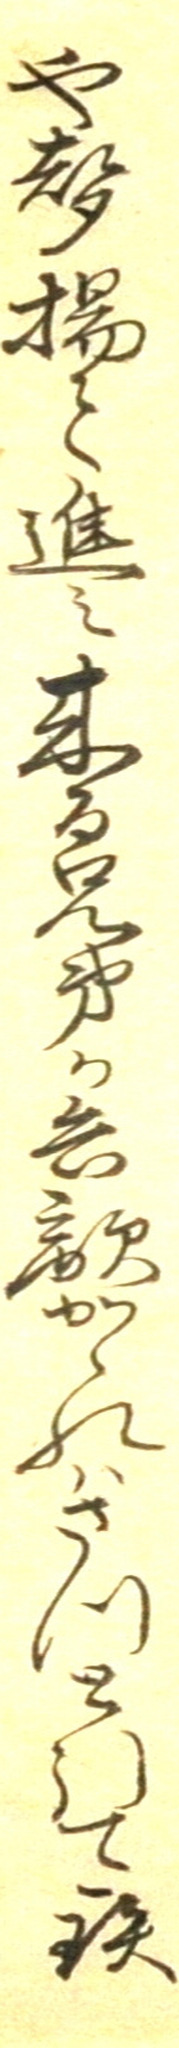や声揚て進み来る兄弟か兵敵かゝれはさつと引て鉄
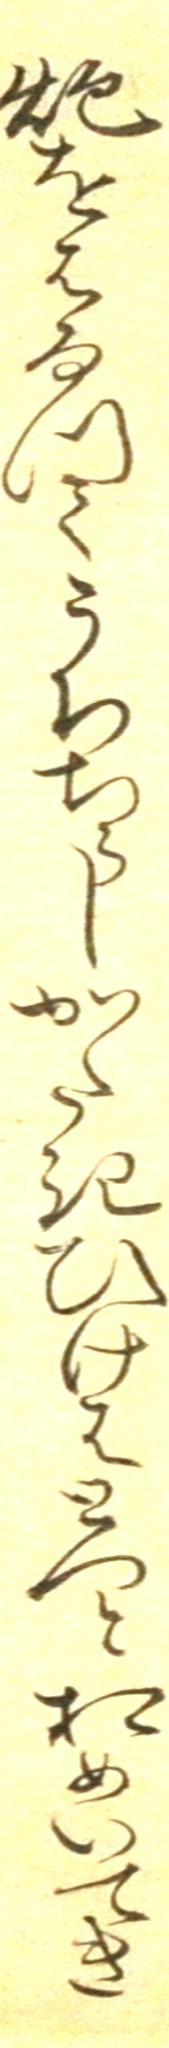炮をはなつてうちちらしかたきひけはとつとおめいてき
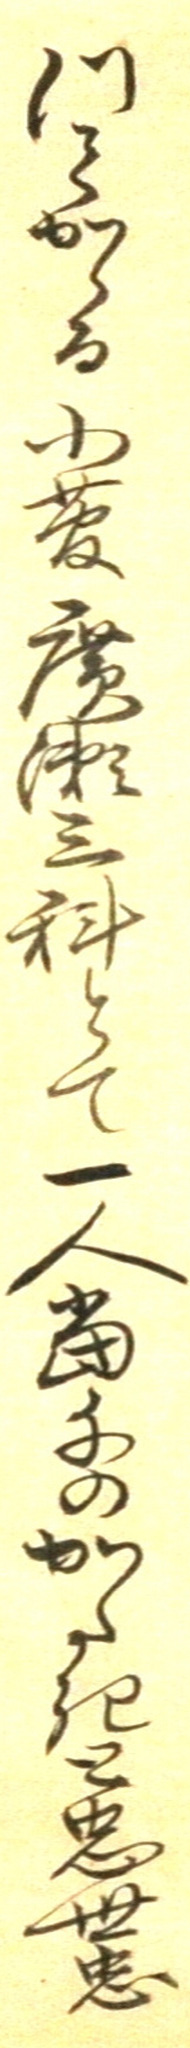つてかゝる小菅廣瀬三科とて一人当千のかたきと忠世忠
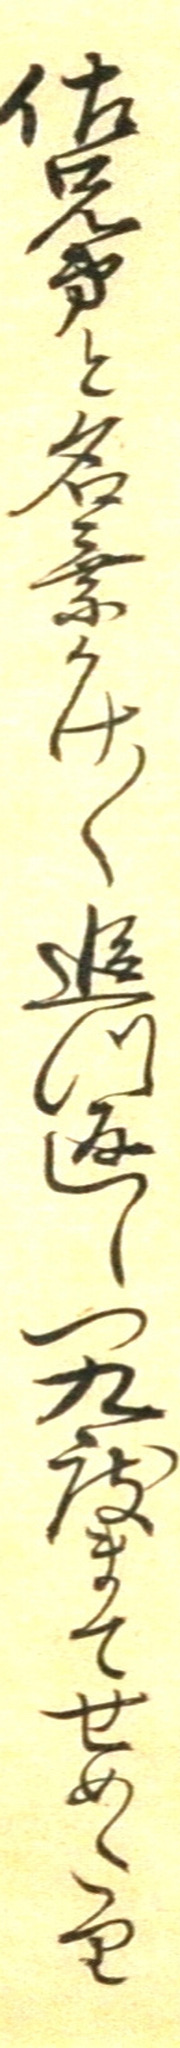佐兄弟と名乗かけ〳〵追つ返しつ九度まてせめたり
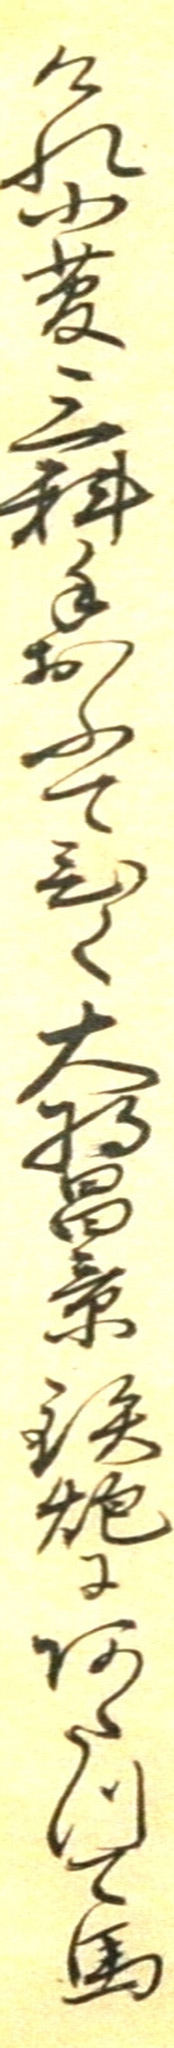けれ小菅三科ておふてひく大将昌景鉄炮にあたつて馬
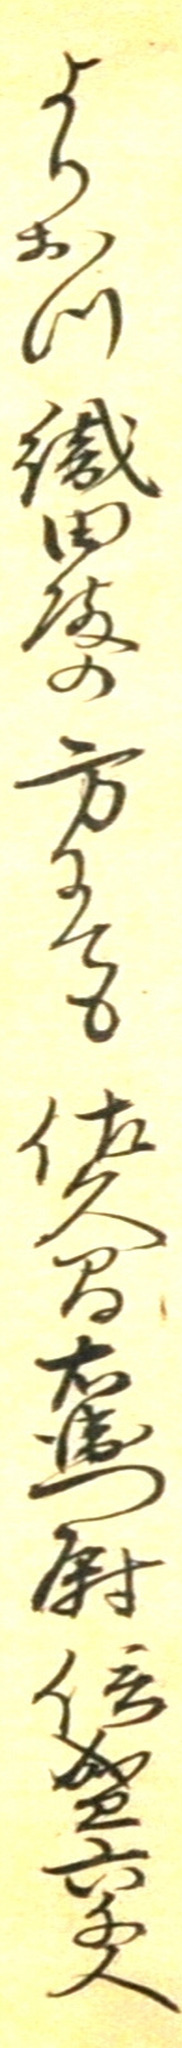よりおつ織田殿の方にても佐久間右衛門尉信盛六千人
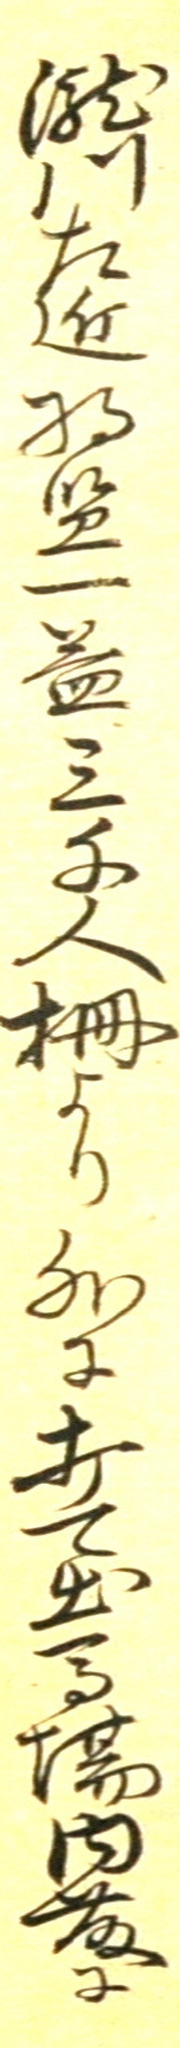瀧川左近将監一益三千人柵より外に打て出馬場内藤に

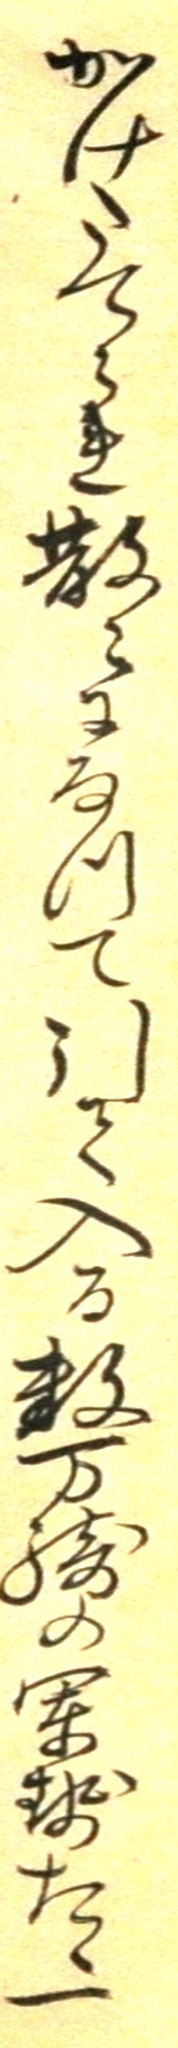かけたてられ散々になつて引て入る数万騎の軍勢たゝ一
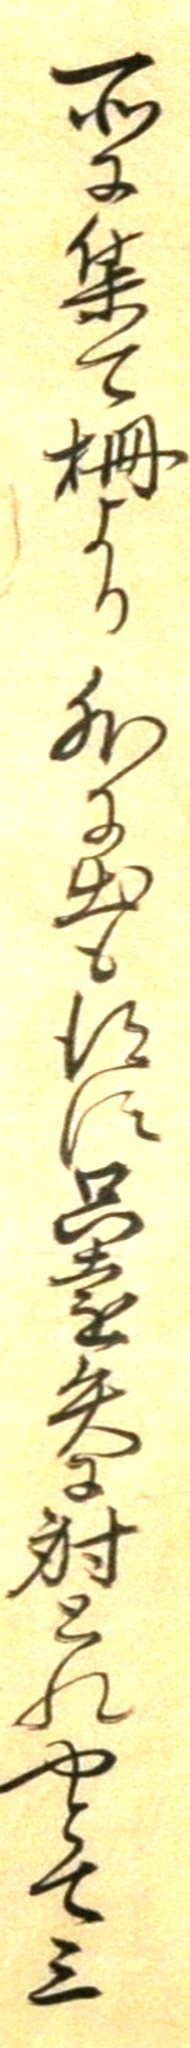所に集て柵より外に出も得す只遠矢に射とれやとて三
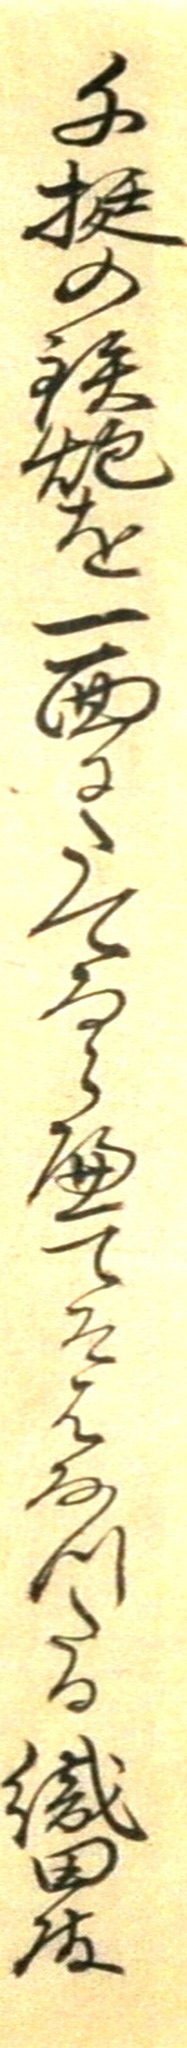千挺の鉄炮を一面にたてならへてそはなつたる織田殿
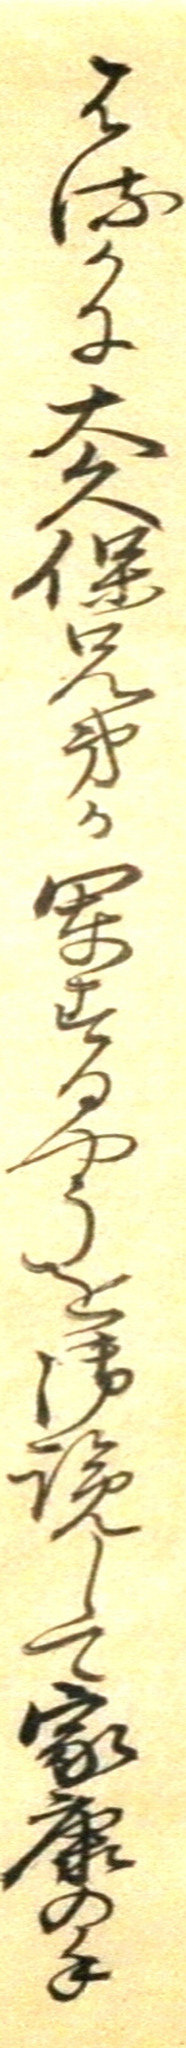はるかに大久保兄弟か軍するやうを御覧して家康の手
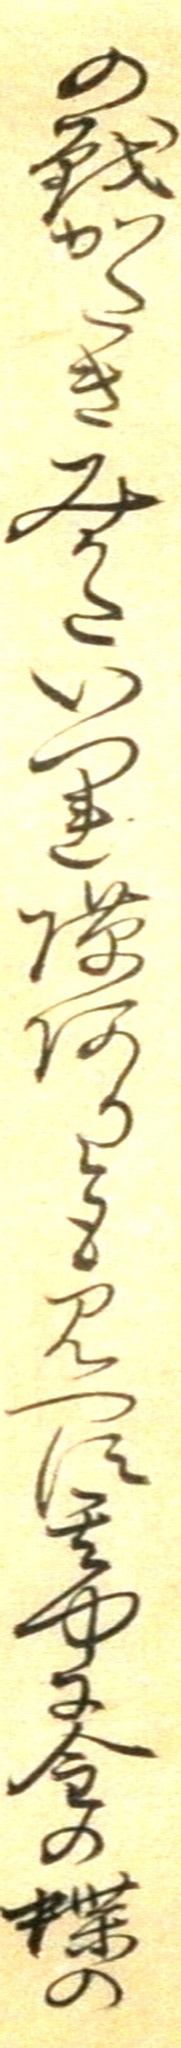の戦かたきみかたいつれ隙ありとも見へす其中に金の蝶の
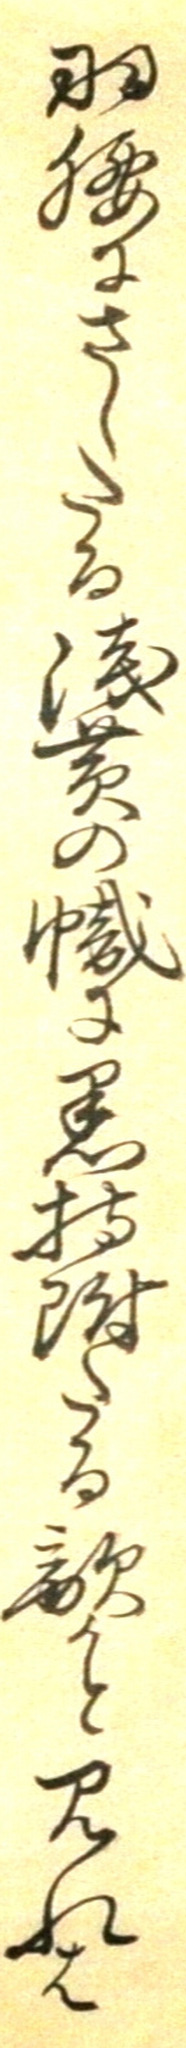羽腰にさしたる浅黄の幟に黒持附たる敵かと見れは
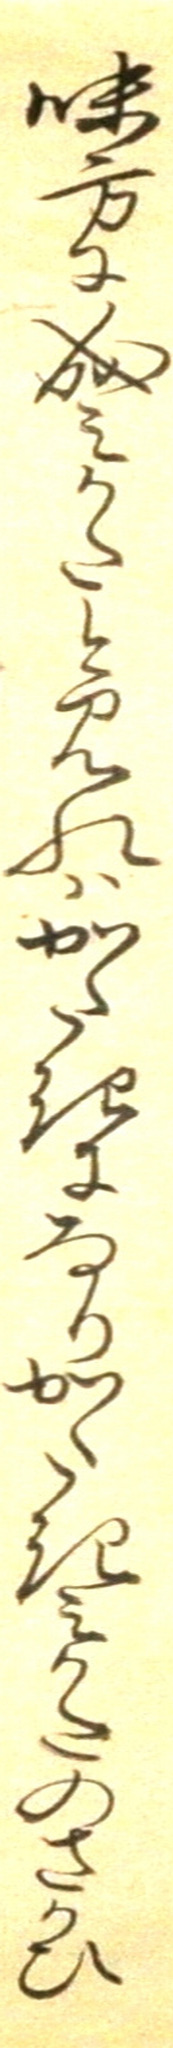味方に成みかたと見れはかたきになりかたきみかたのさかひ
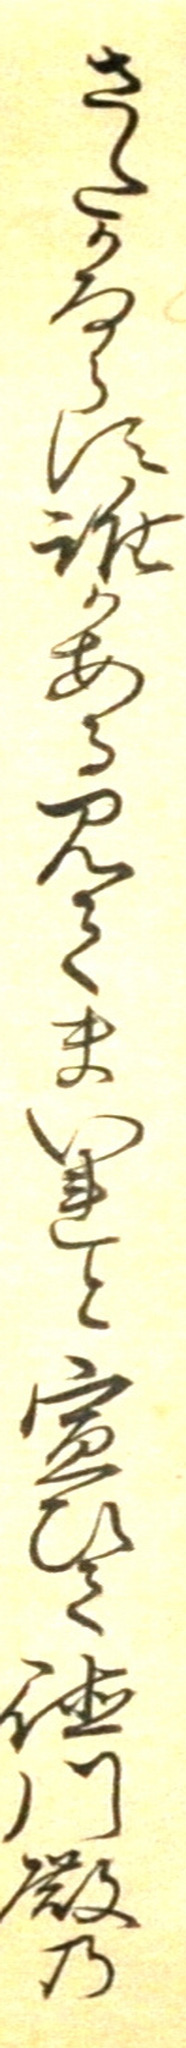さたかならす誰かある見てまいれと宣ひて徳川殿の
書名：藩翰譜（四・中）
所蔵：伊那市立高遠町図書館・合同会社AMANE
